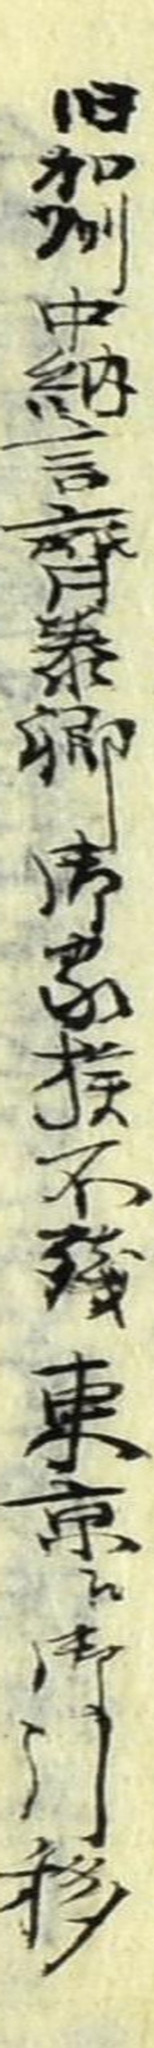旧加州中納言斉泰卿御家族不残東京江御引移

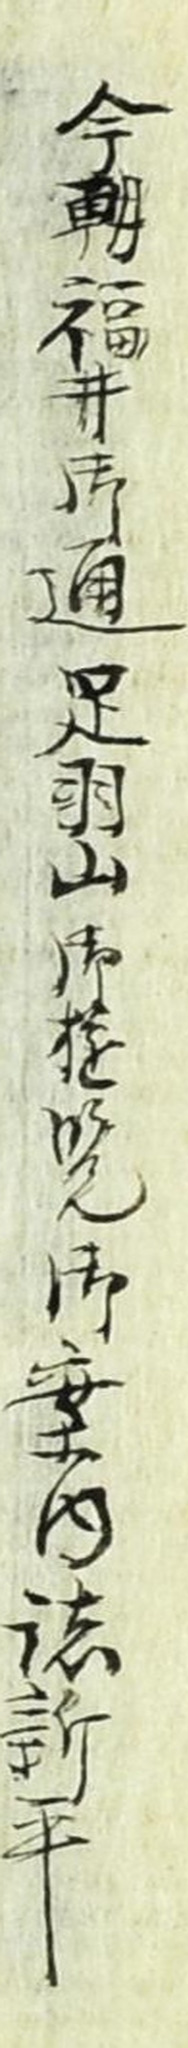今朝福井御通足羽山御遊覧御案内諸新平
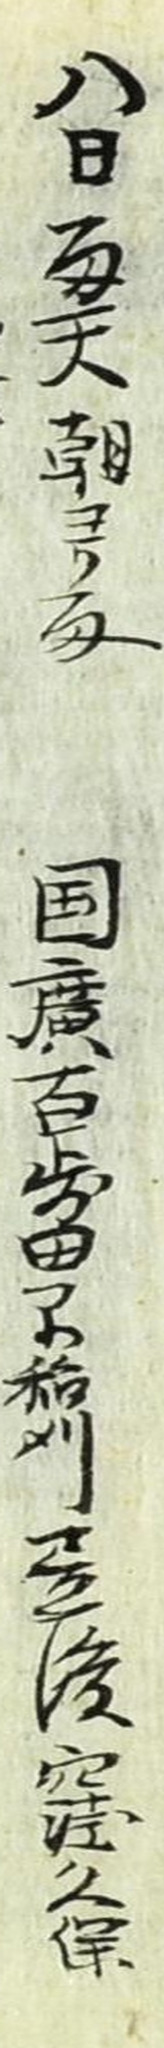八日雨天朝ヨリ雨国広百歩田早稲刈昼後窪久保
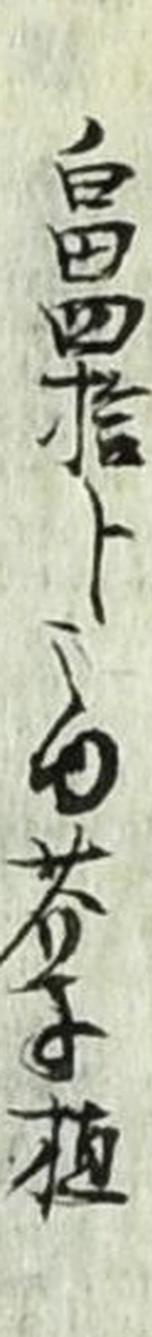畠四拾歩之内芥子植
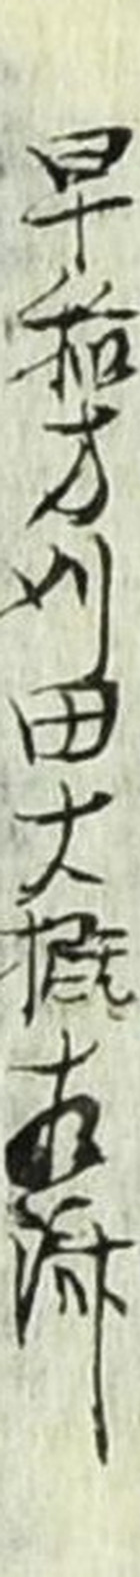早稲方刈大概相済
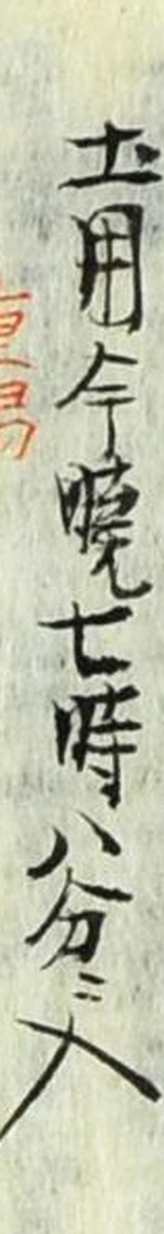土用今暁七時八分ニ入
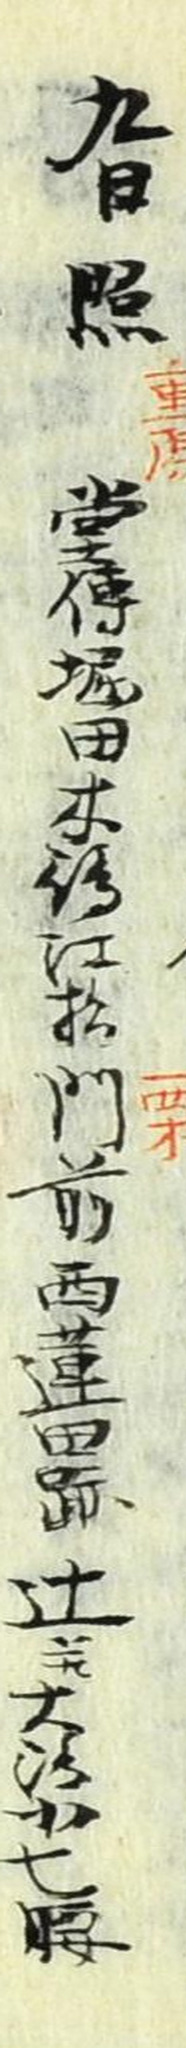九日照堂伝堀田木島江松門前西蓮田跡辻并大島小七腰
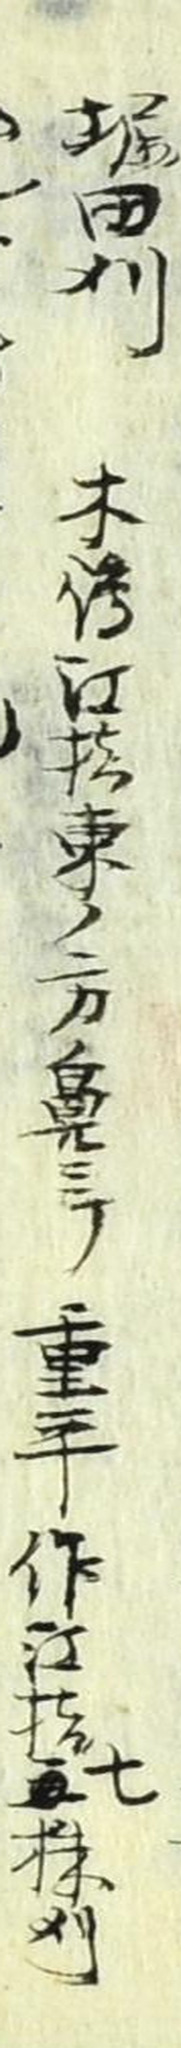堀田刈木島江指東ノ方鼻ニテ重平作江指七株刈
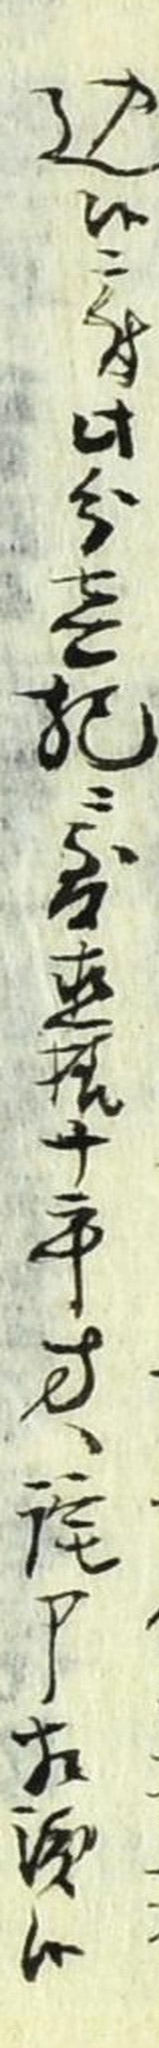込候ニ付此分壱起ニ到直様十平方へ詫申相渡候
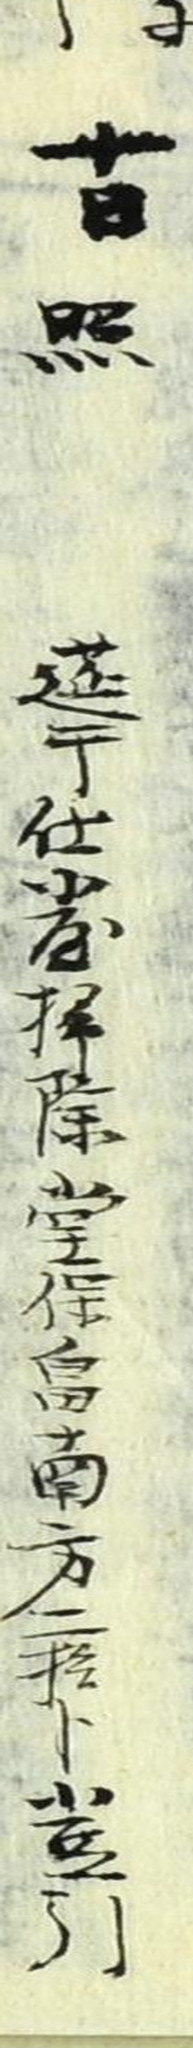十日照莚干仕小屋掃除堂保畠南方二拾歩小豆引
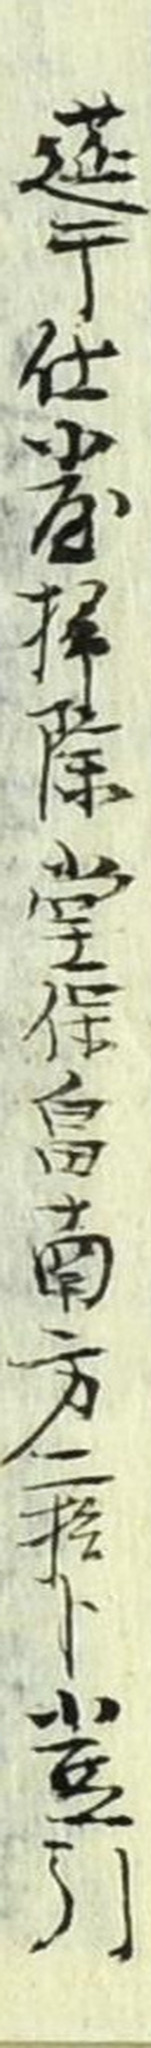十日照莚干仕小屋掃除堂保畠南方二拾歩小豆引
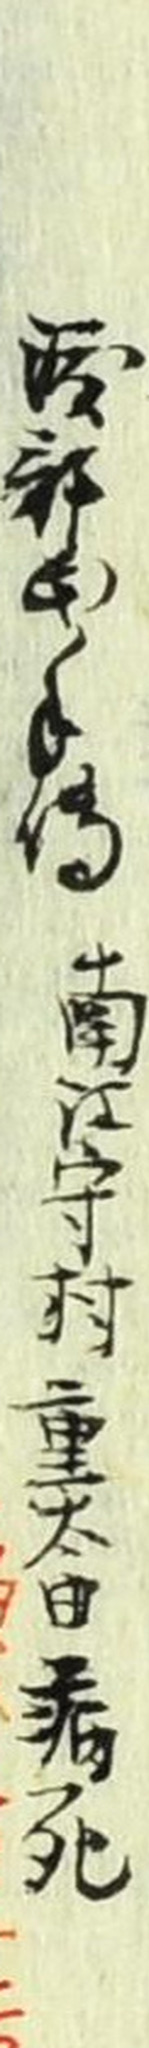十二日照渡部氏手伝南江守村重太由病死
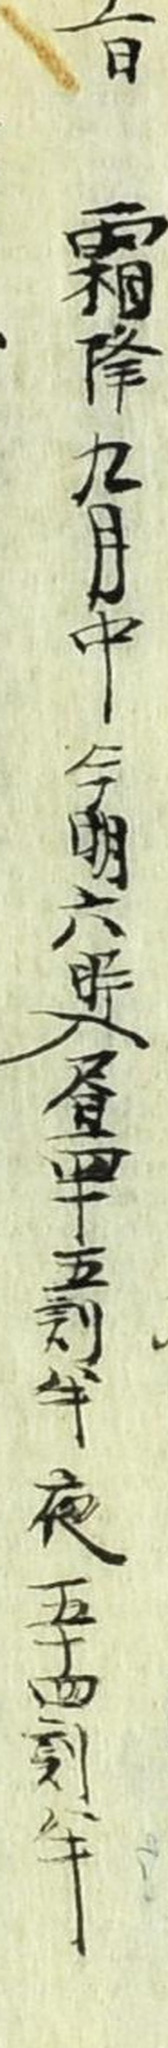十一日霜降九月中今明六時入昼四十五刻半夜五十四刻半
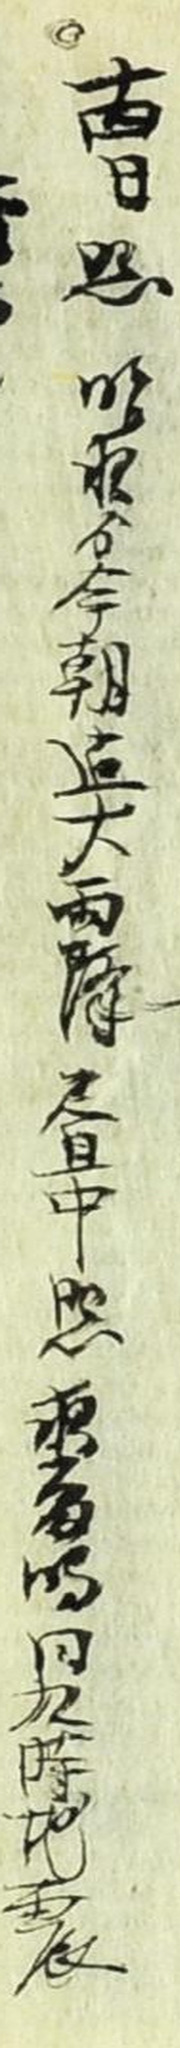○十四日照昨夜ゟ今朝迄大雨降昼中照夜雷鳴同九時地震
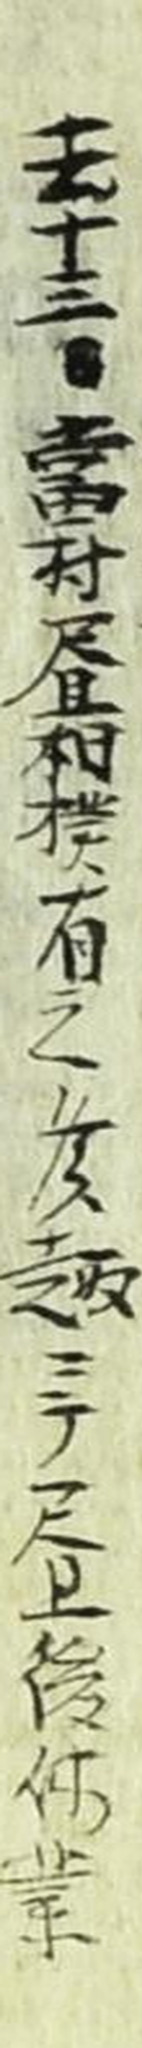去十三日当村昼相撲有之候趣ニテ昼後休業
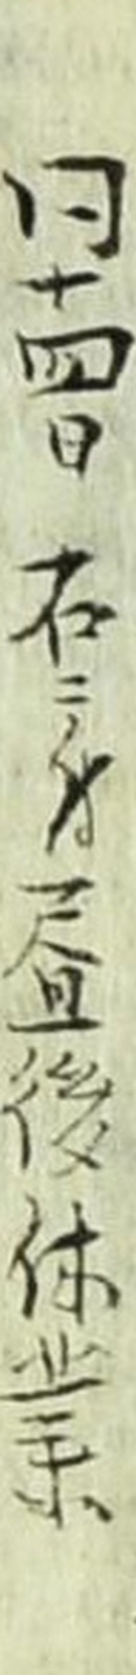同十四日右ニ付昼後休業
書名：（日記）
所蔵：福井県文書館 Fukui Prefectural Archives
